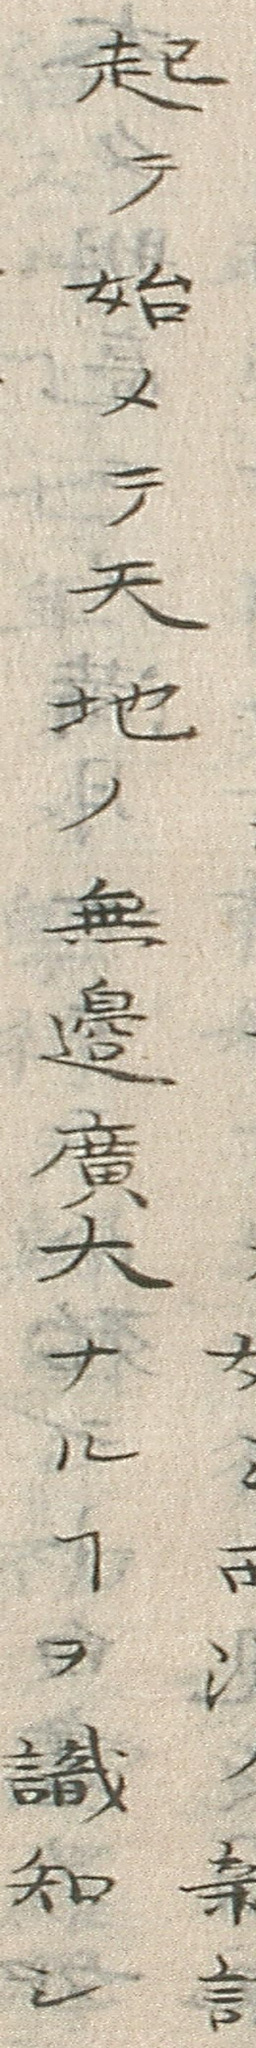起テ始メテ天地ノ無辺広大ナルコトヲ識知シ
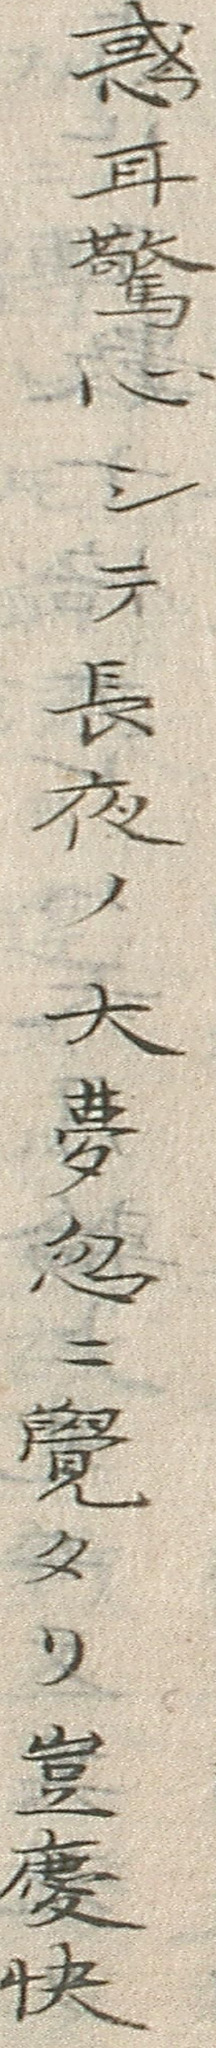惑耳驚心シテ長夜ノ大夢忽ニ覚タリ豈慶快
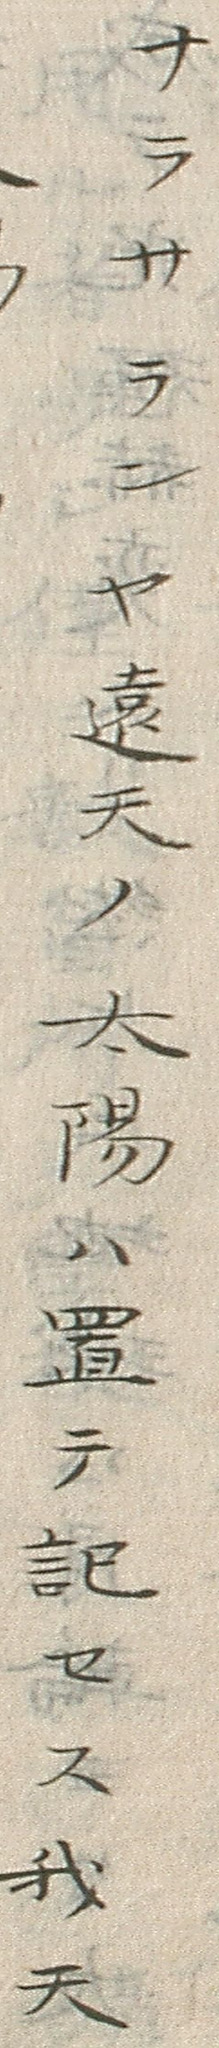ナラサランヤ遠天ノ太陽ハ置テ記セス我天
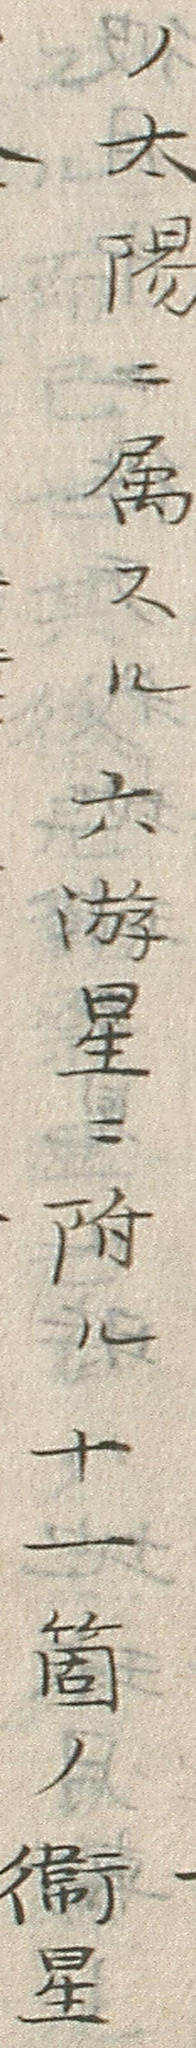ノ太陽ニ属スル六游星ニ附ル十一箇ノ衛星
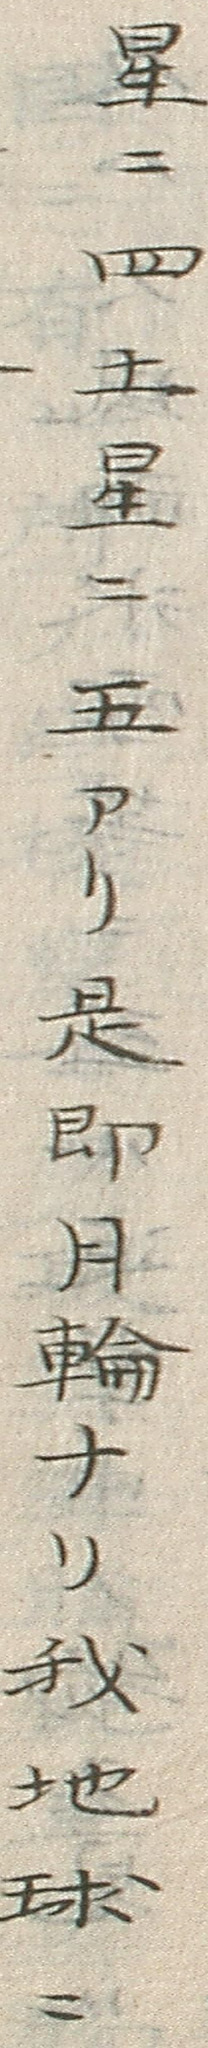星ニ四土星ニ五アリ是即月輪ナリ我地球ニ
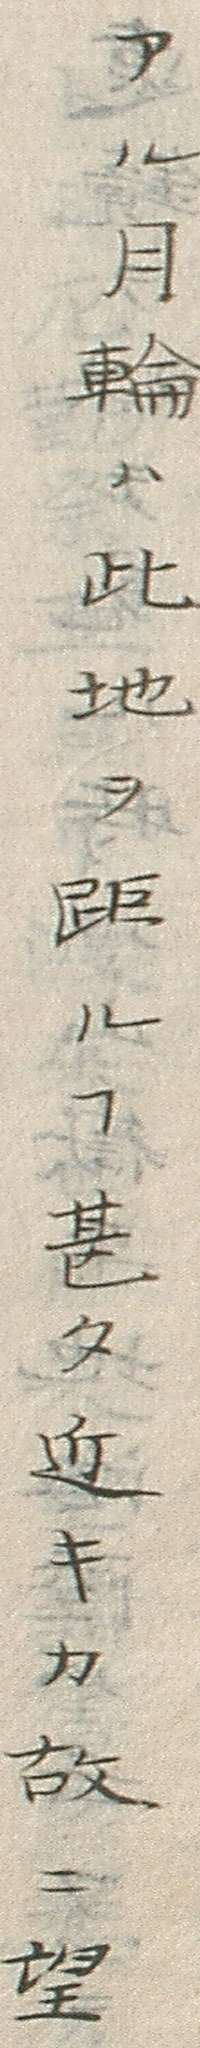アル月輪ハ此地ヲ距ルコト甚タ近キカ故ニ望

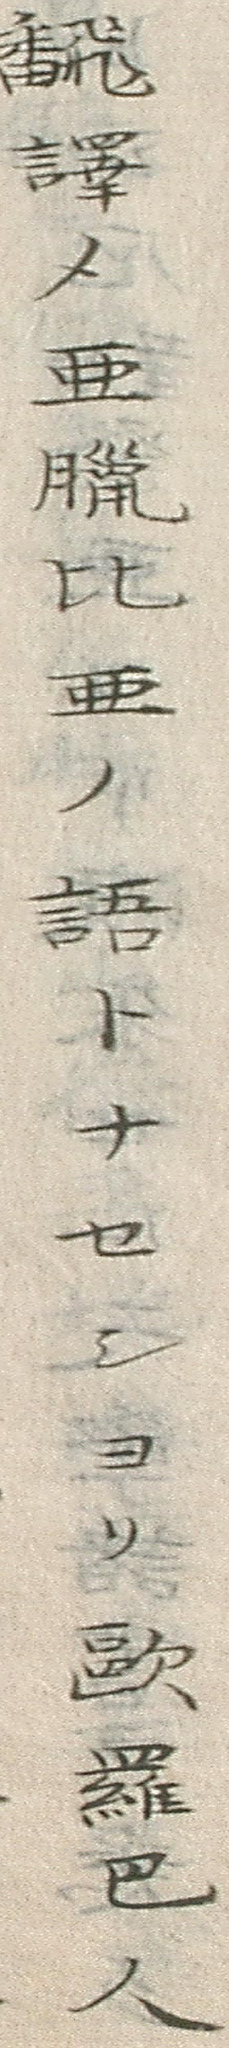翻訳ノ亜臘比亜ノ語トナセシヨリ欧羅巴人
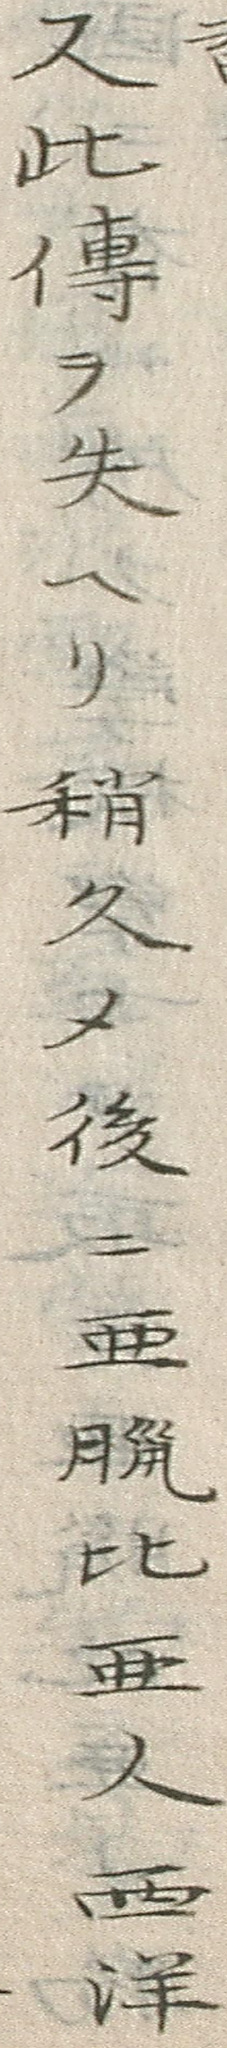又此伝ヲ失ヘリ稍久シテ後ニ亜臘比亜人西洋
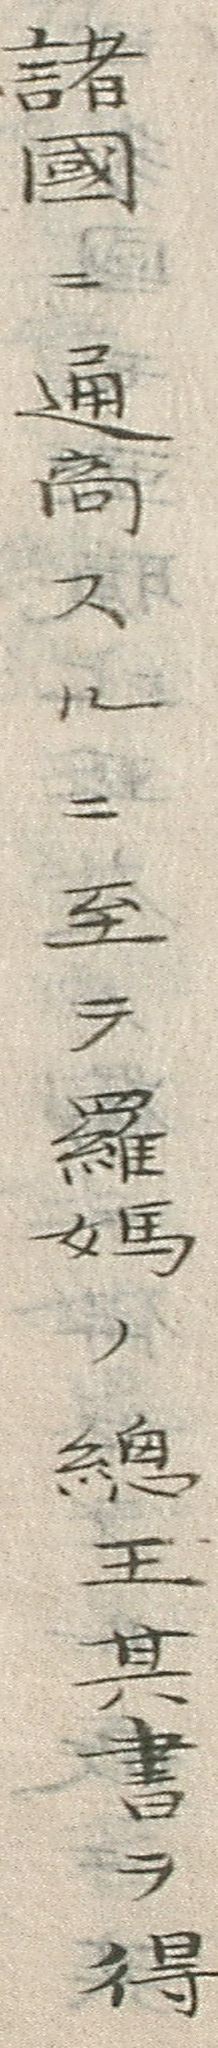諸国ニ通商スルニ至ヲ羅媽ノ総王其書ヲ得
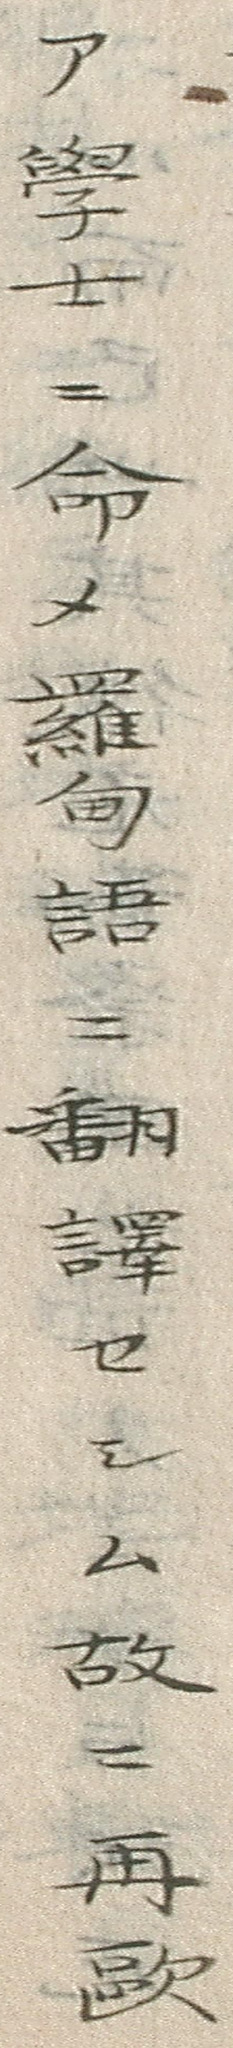ア学士ニ命シテ羅甸語ニ翻訳セシム故ニ再欧
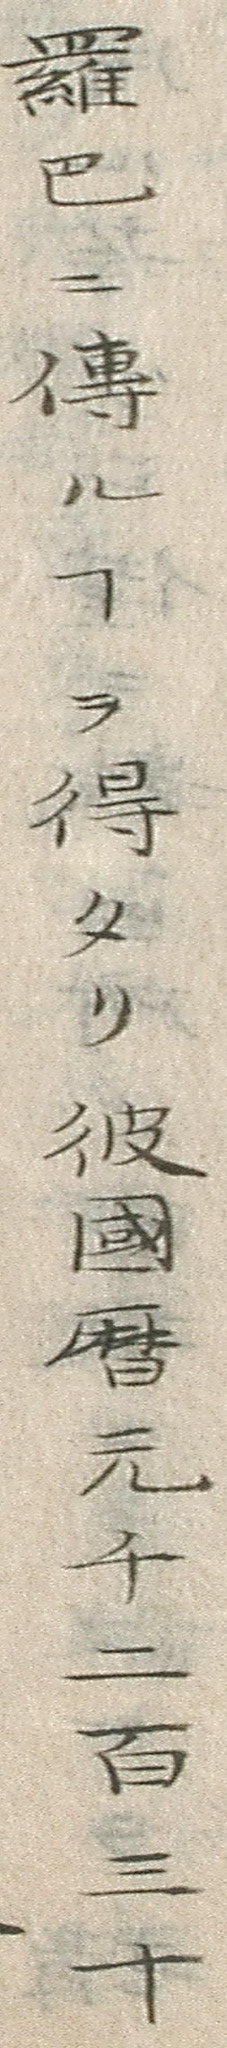羅巴ニ伝ルコトヲ得タリ彼国暦元千二百三十
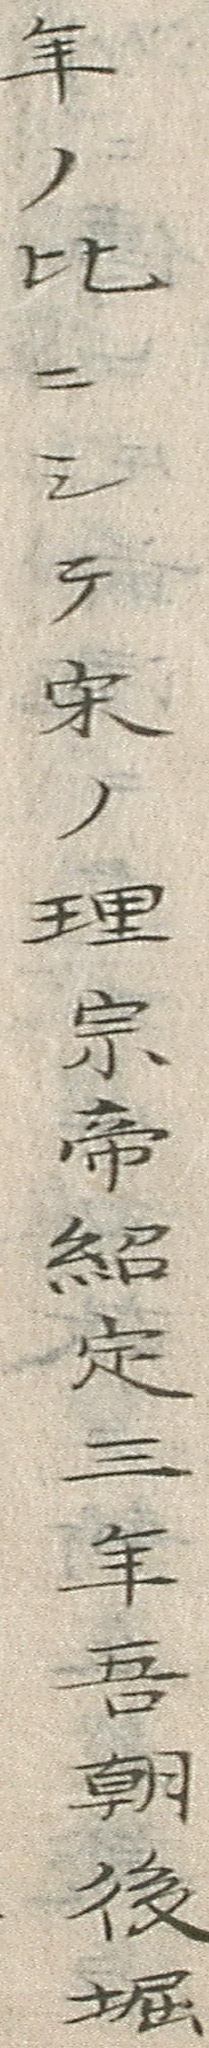年ノ比ニシテ宋ノ理宗帝紹定三年吾朝後堀
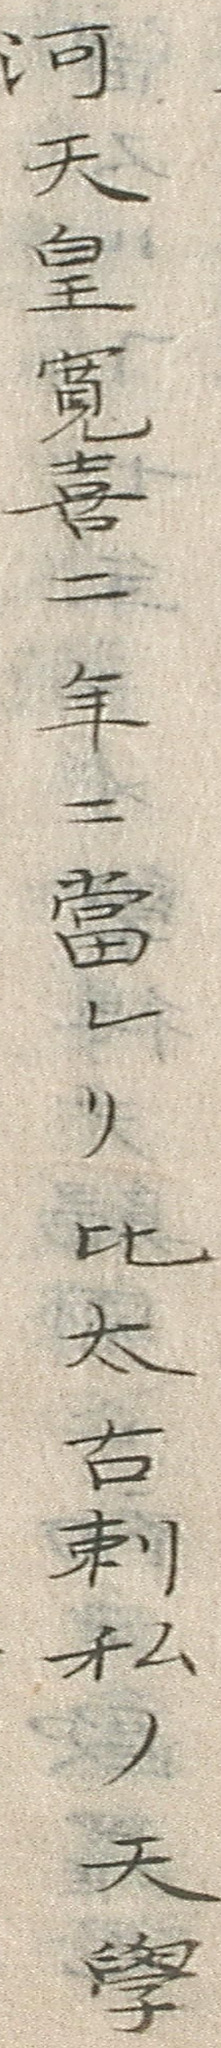河天皇寛喜二年ニ当レリ比太古刺私ノ天学
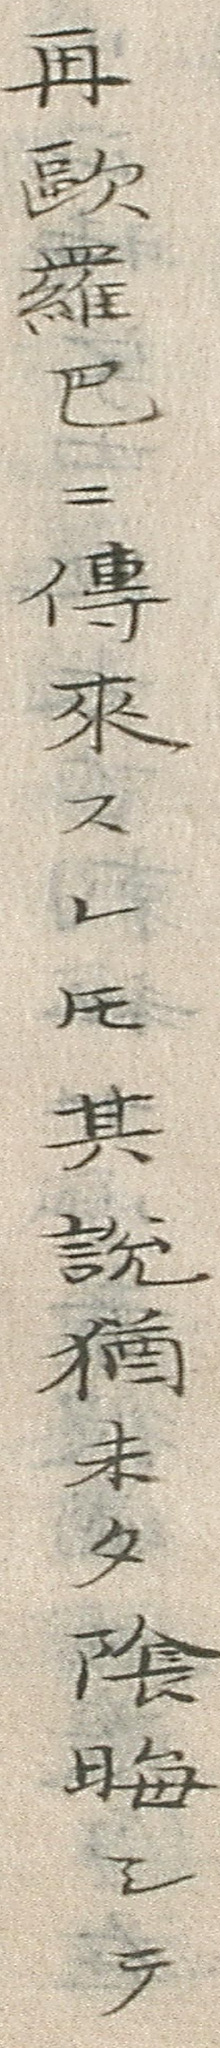再欧羅巴ニ伝来スレトモ其説猶未タ陰晦シテ
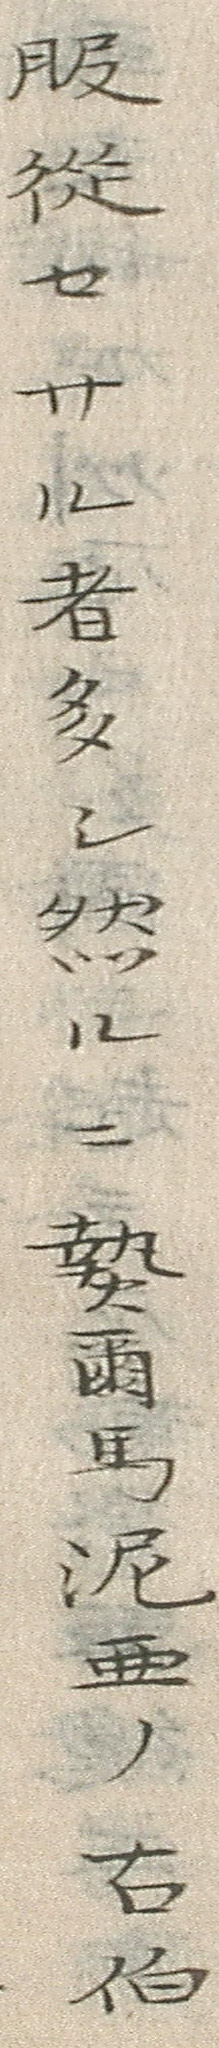服従セサル者多シ然ルニ熱爾馬泥亜ノ古伯
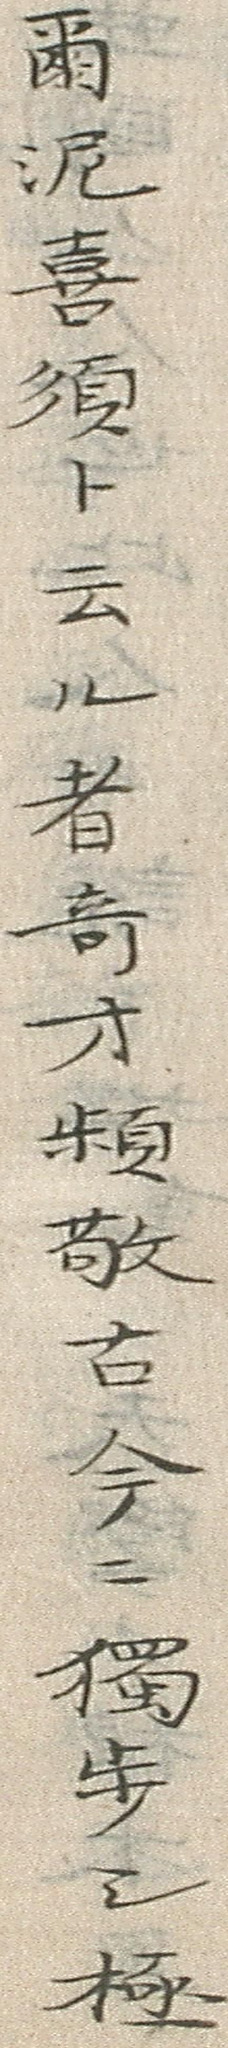爾泥喜須ト云ル者奇才頻敬古今ニ独歩シ極
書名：天學略名目羽翼　全
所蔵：東京大学地震研究所図書室 Earthquake Research Institute Library, The University of Tokyo, JAPAN
